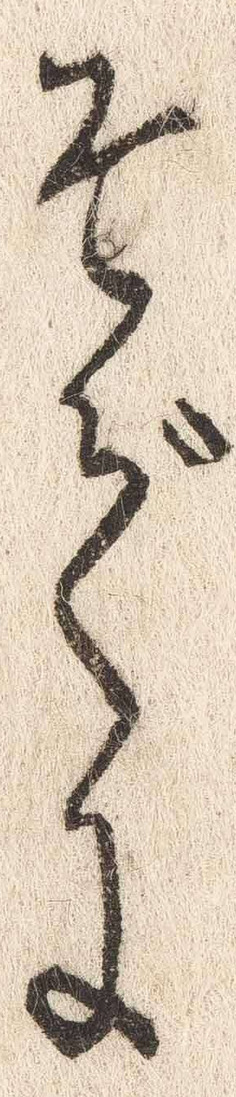そでに

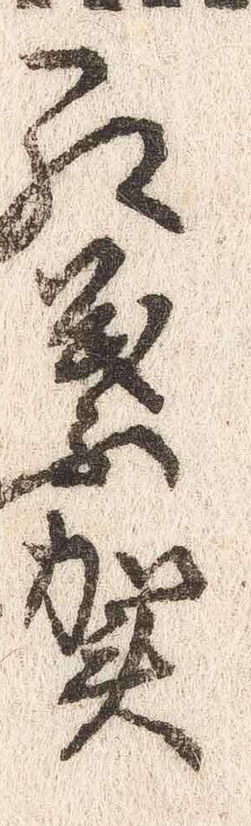紅葉賀
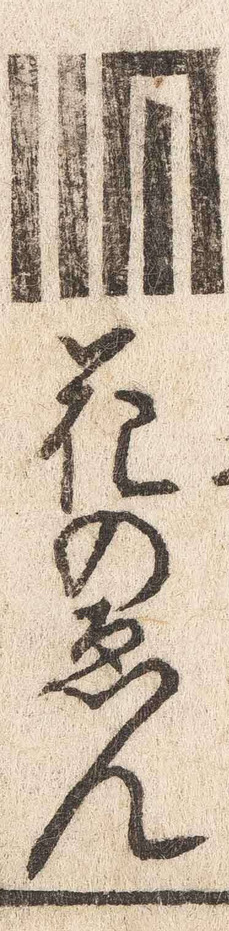花のゑん
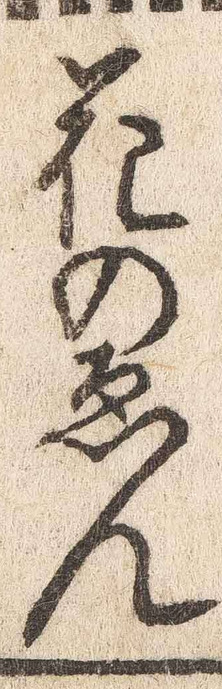花のゑん

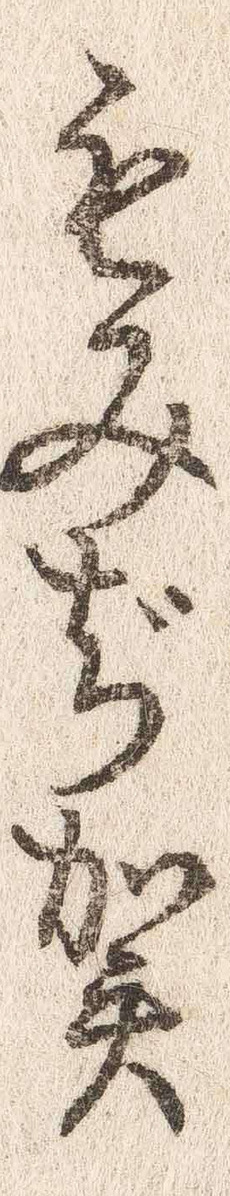もみぢ賀
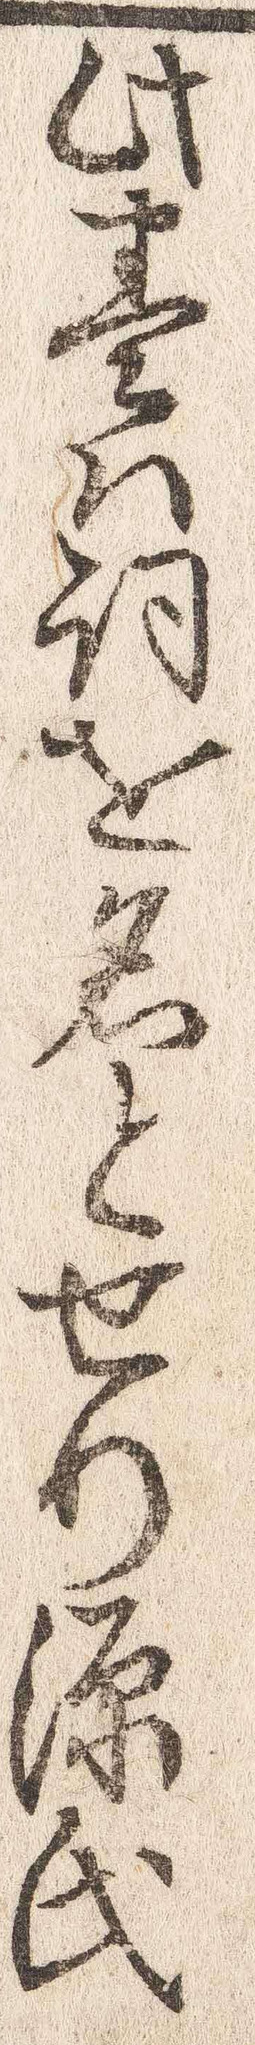此巻は詞を名とせり源氏
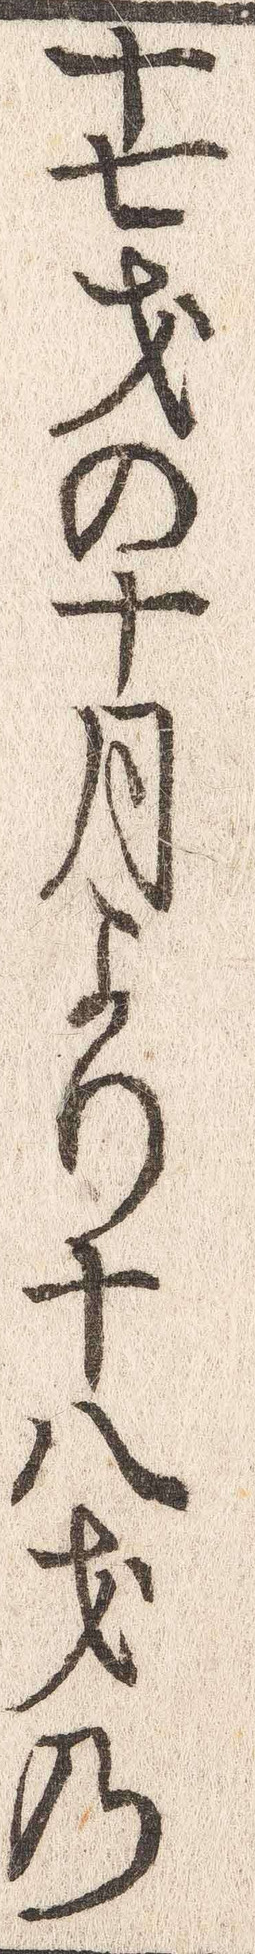十七才の十月より十八才の
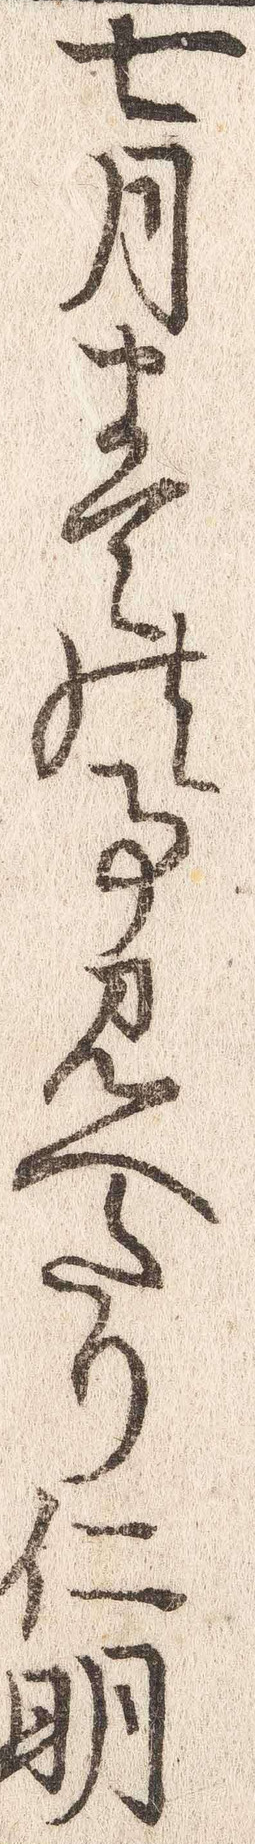七月まての事見へたり仁明
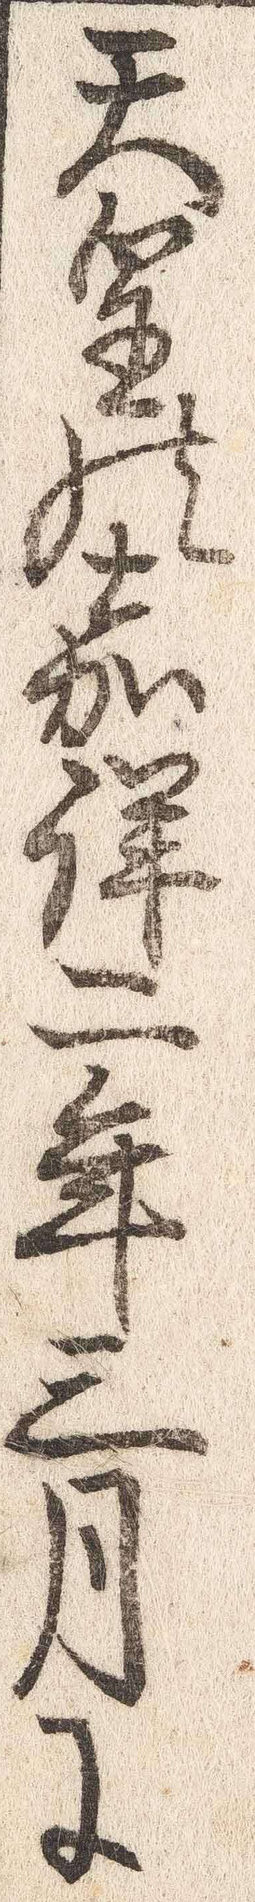天皇の嘉祥二年三月に
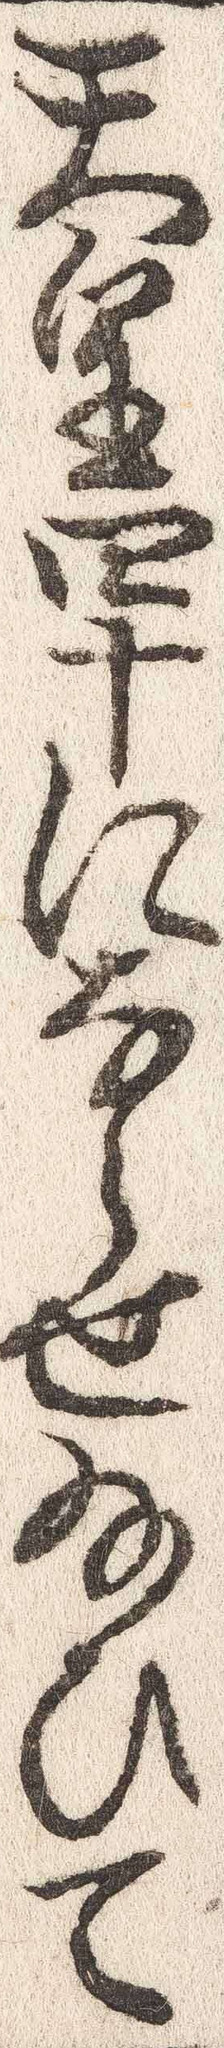天皇四十にならせ給ひて
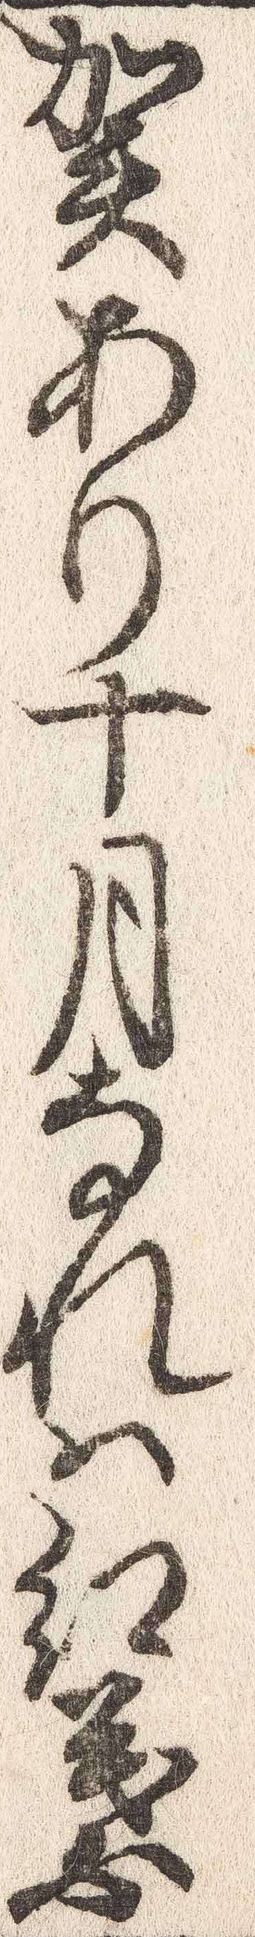賀あり十月なれは紅葉
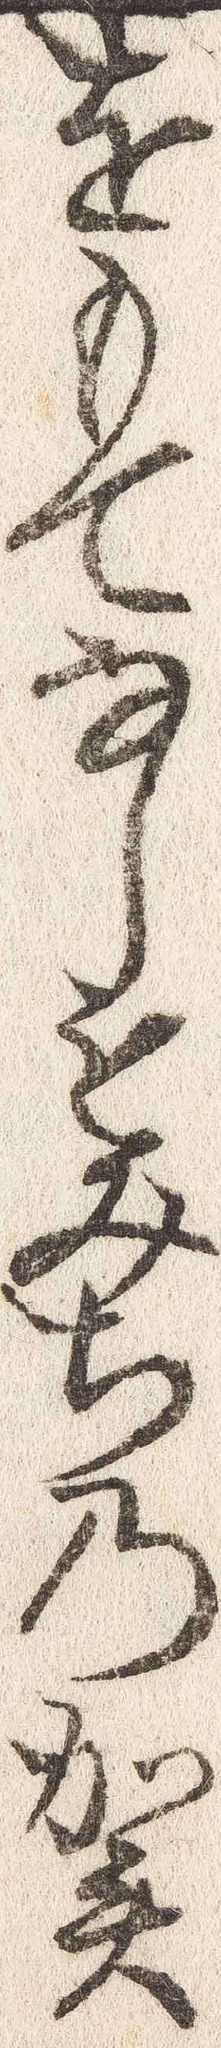をもてなしもみちの賀
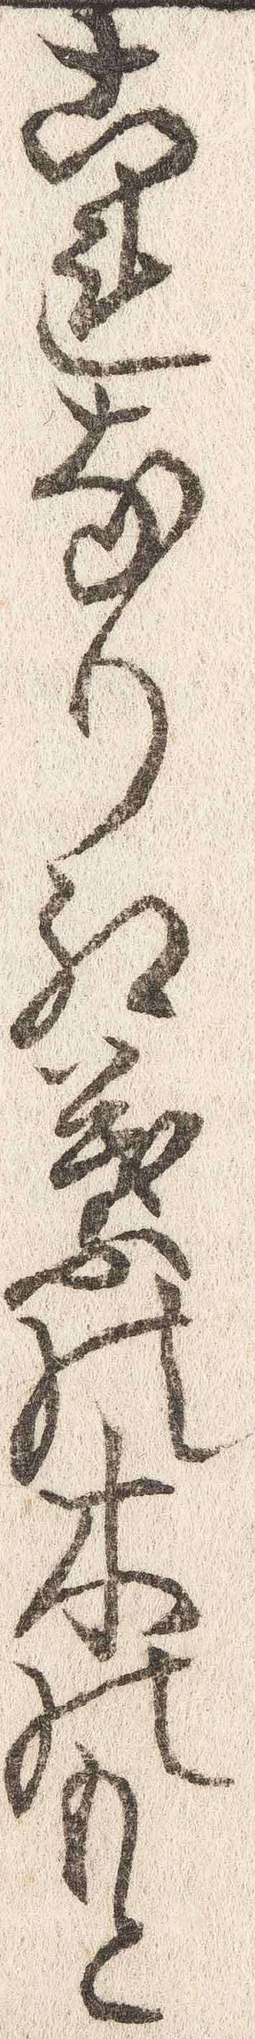これなり紅葉の木のもと
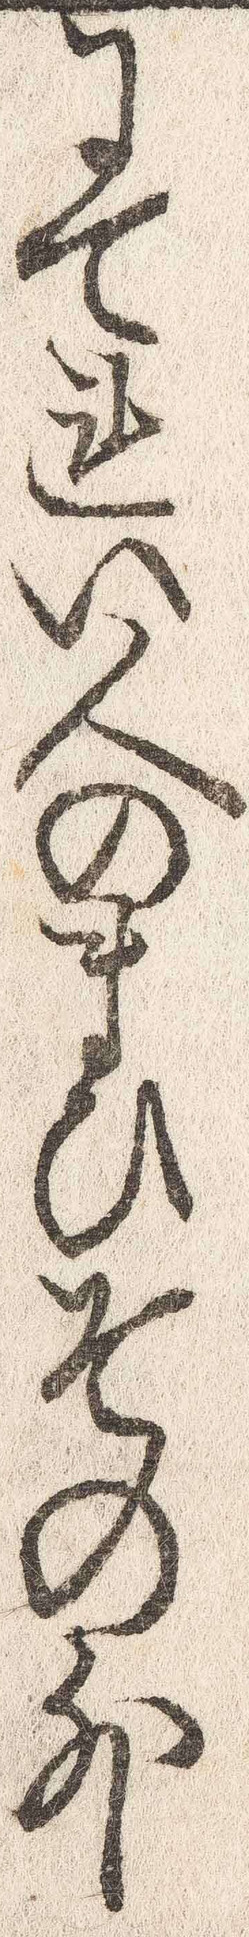にてれい人のまひその外

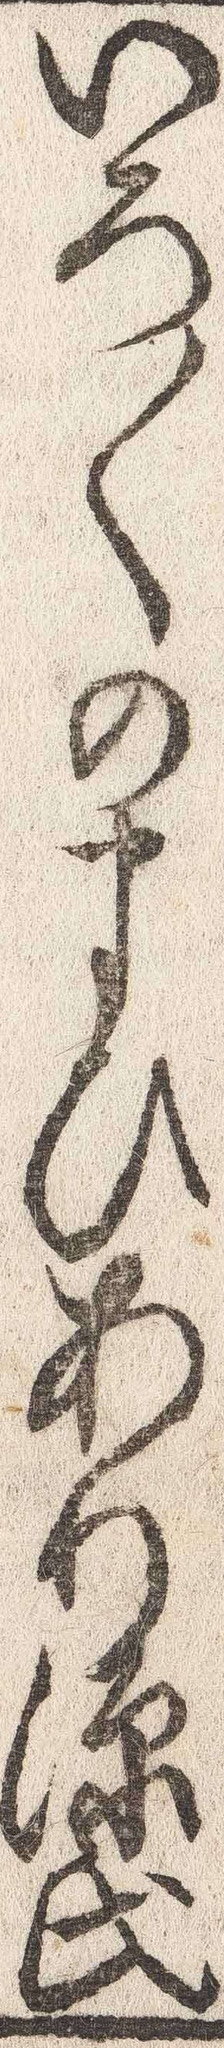いろ〳〵のまひあり源氏
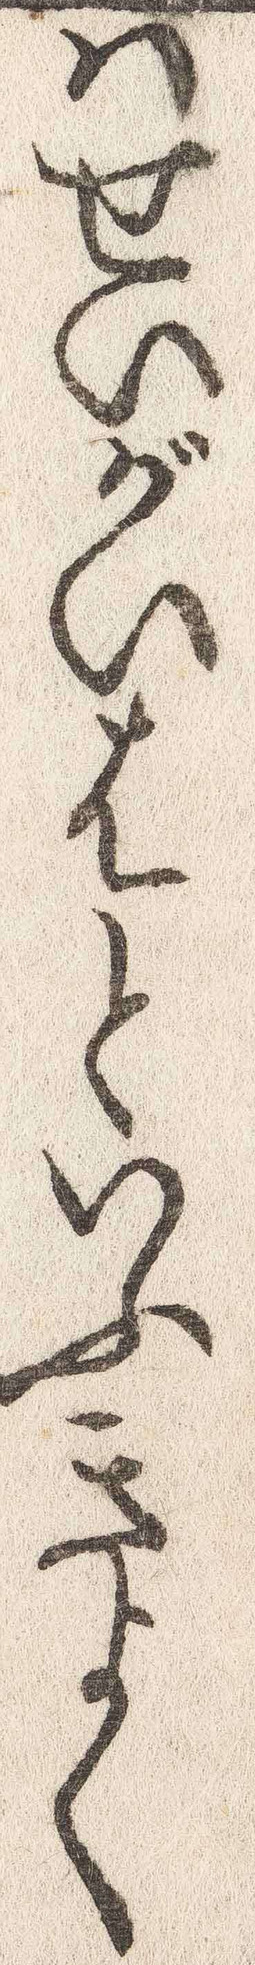はせいがいはといふきよく
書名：源氏物語
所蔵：東京学芸大学附属図書館 国文学研究資料館
